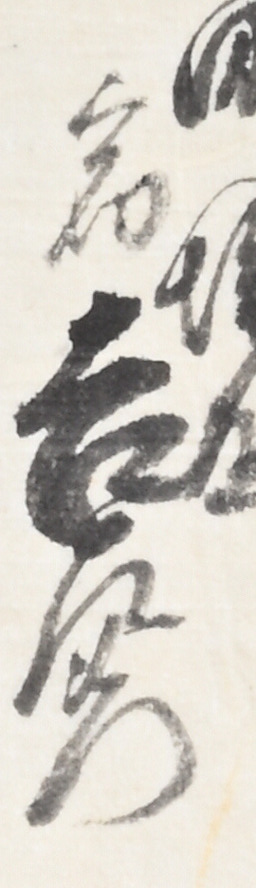宿吉左衛門
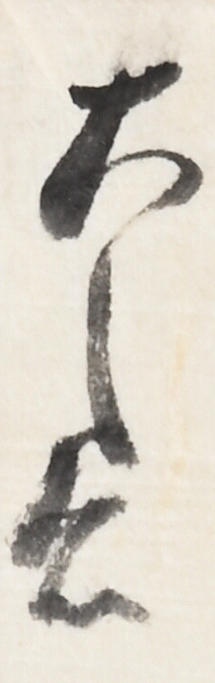右之者
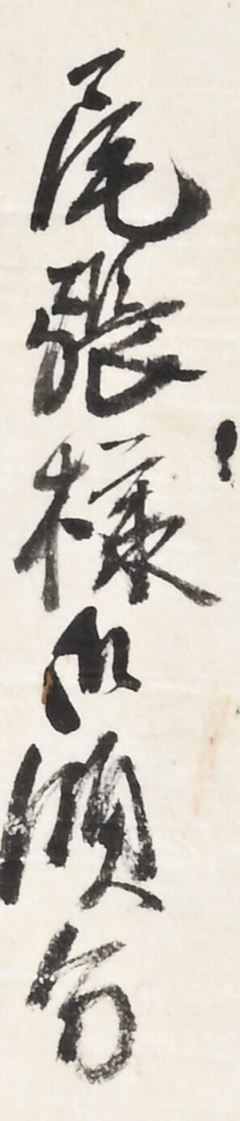尾張様御領分
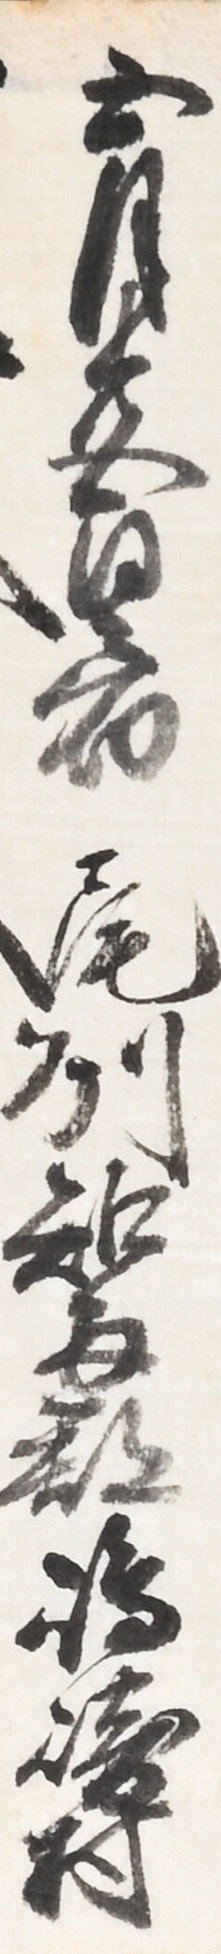五月廿五日尾州知多郡嶋崎村
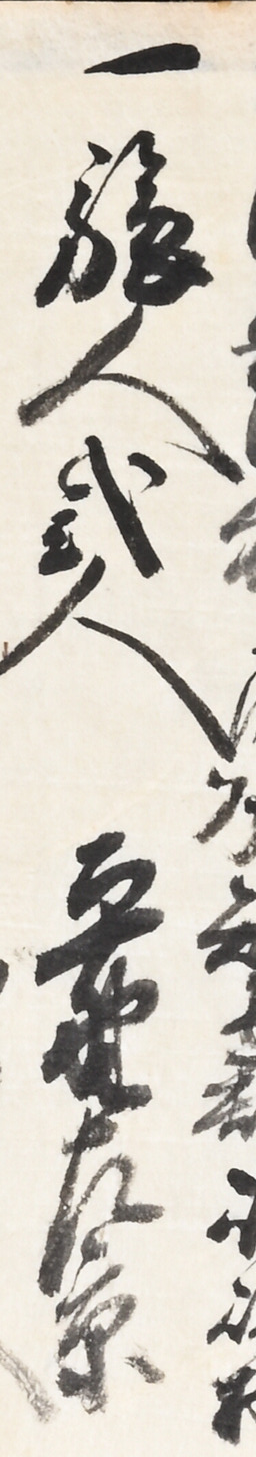一旅人弐人平野左京
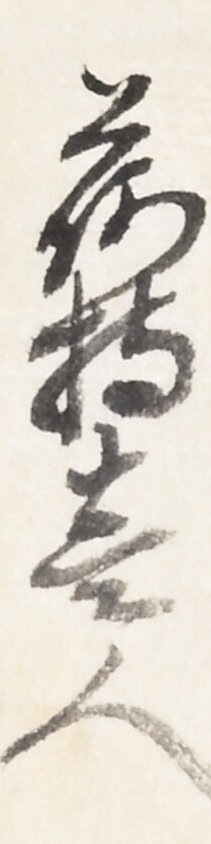荷持壱人
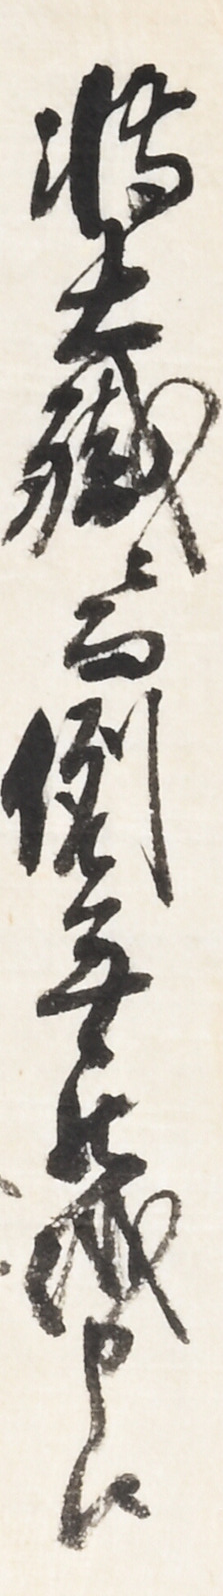転土職ニ而例年罷越申候
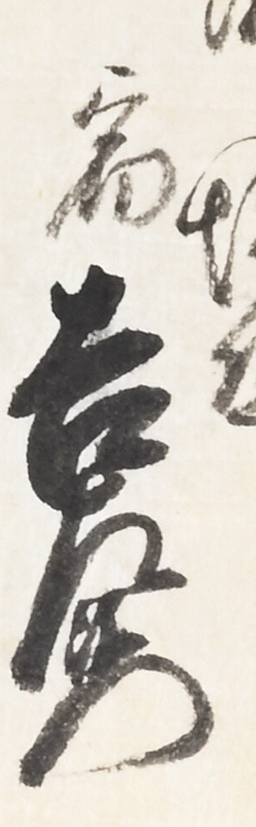宿吉左衛門
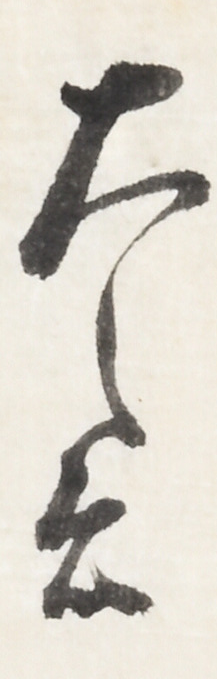右之者
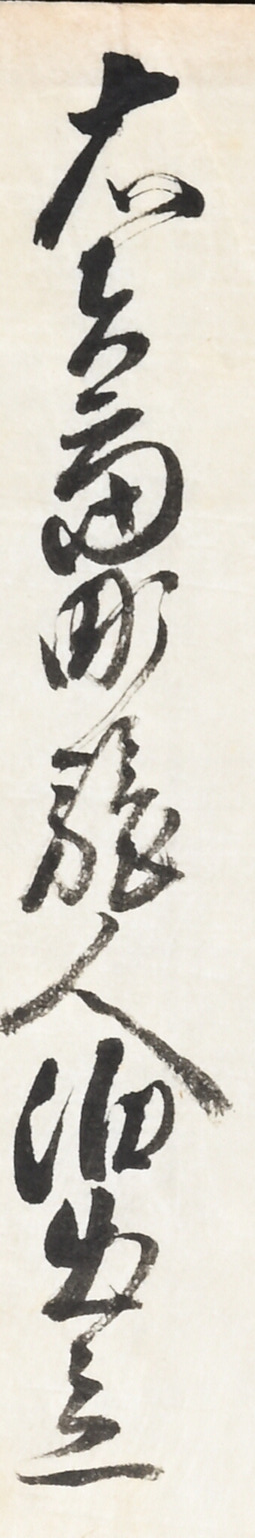右者当町旅人泊出立
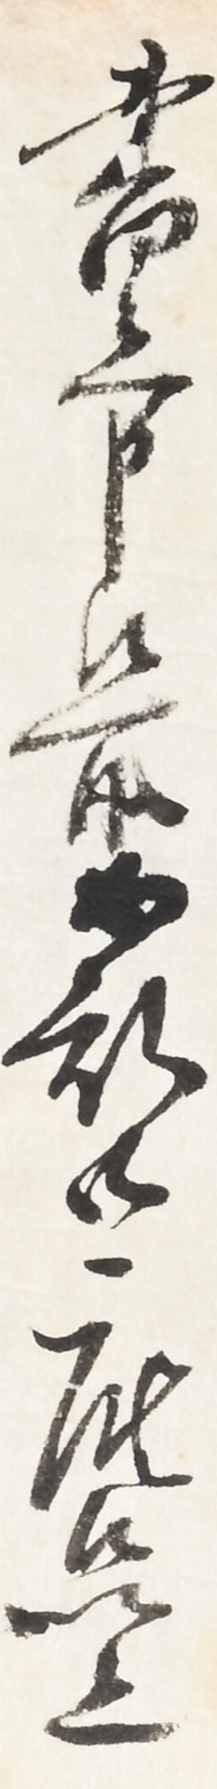書上申候所如斯御座候以上
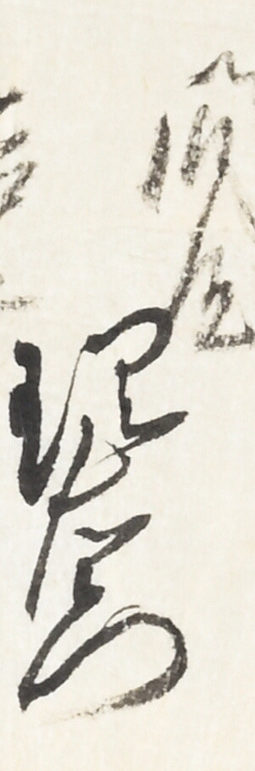理右衛門
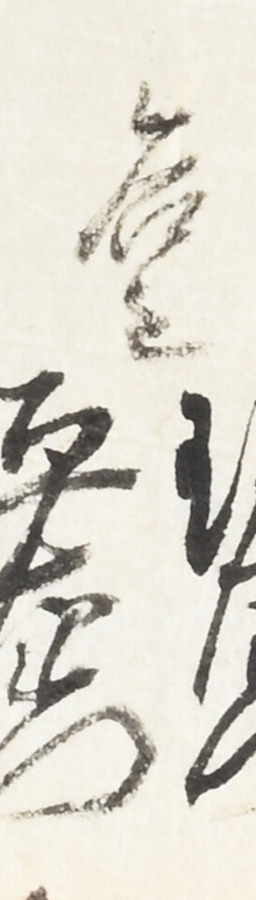五月平右衛門
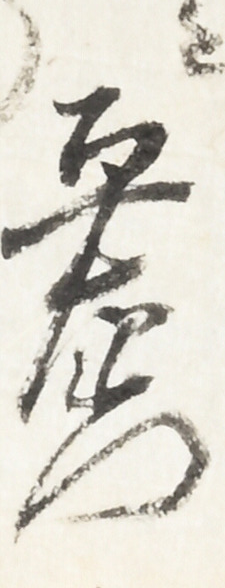理右衛門
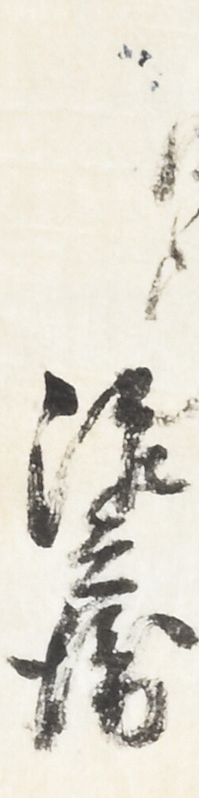治兵衛
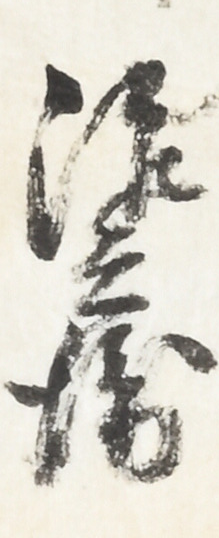治兵衛
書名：旅人泊控帳
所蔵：伊那市立高遠町図書館・合同会社AMANE
